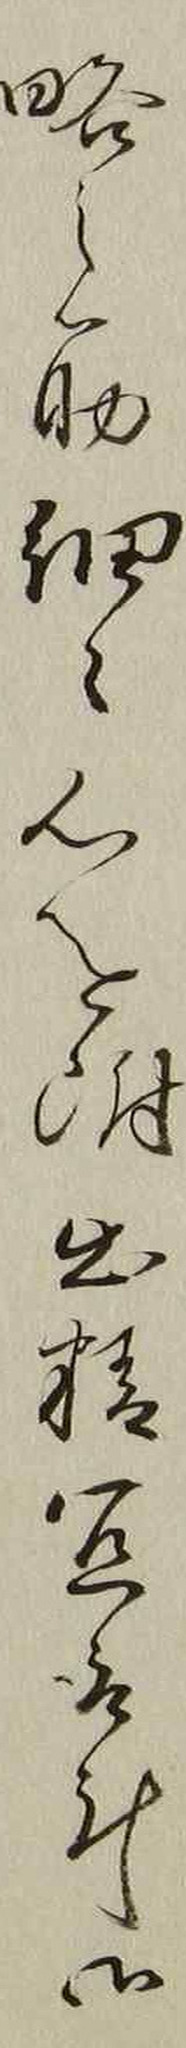略之筋細々心を附出精宜取計御
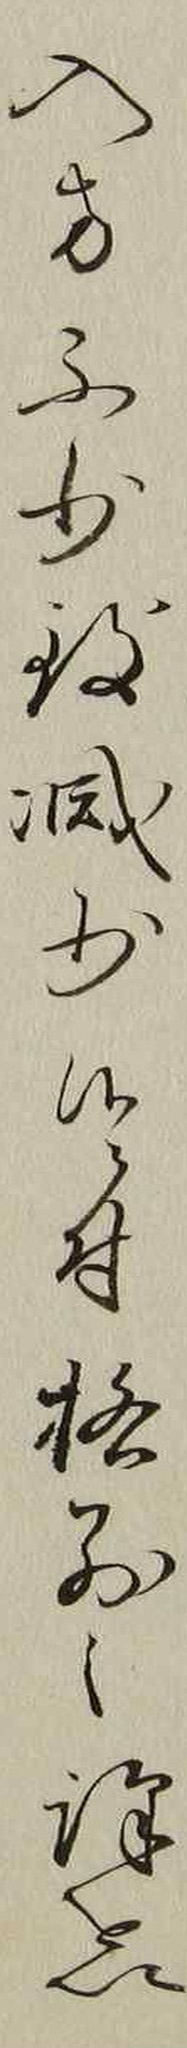入方不少致減少候ニ付格別之訳を以
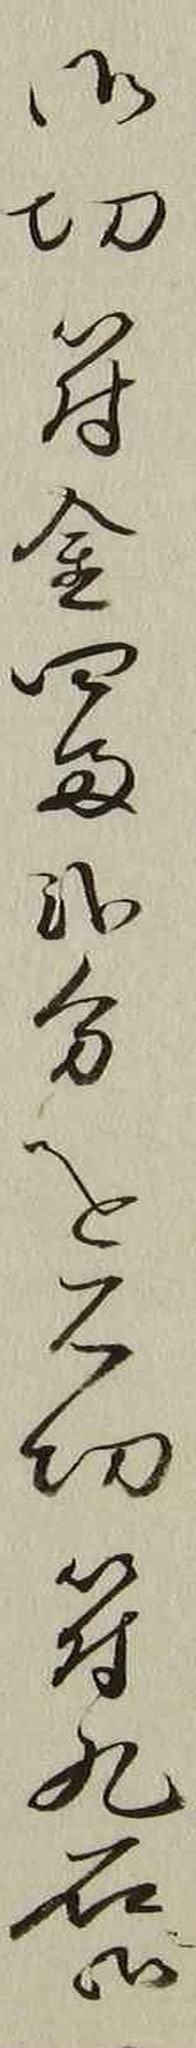御切符金四両弐分を右切符九石御
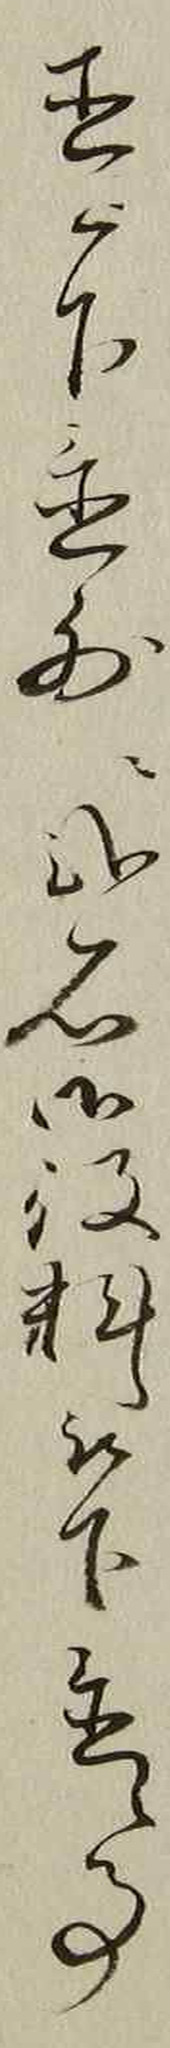直被下置外ニ弐石役料被下置候事
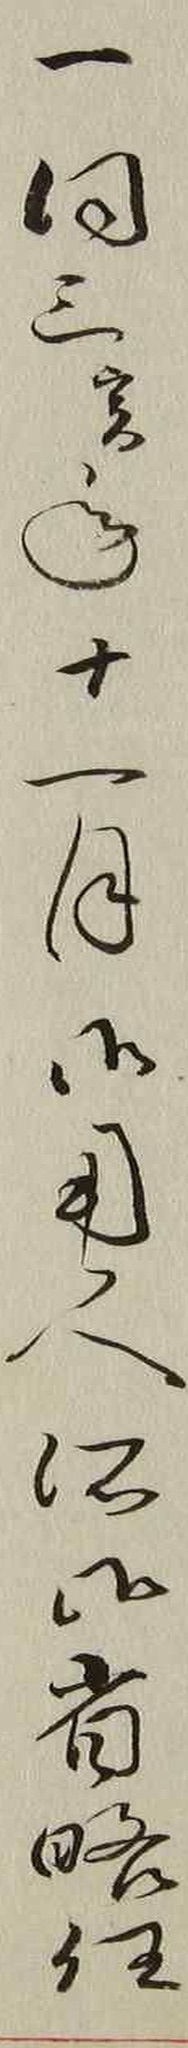一同三寅年十一月御用人所御省略任
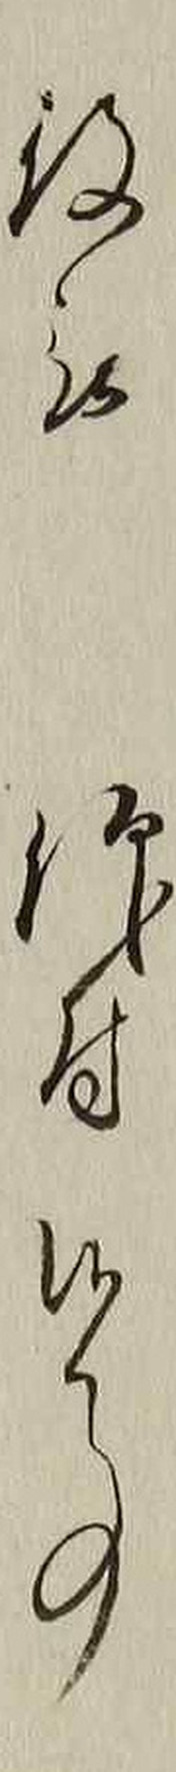役被仰付候事
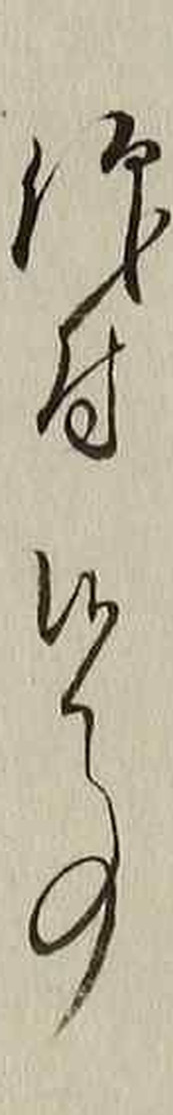仰付候事
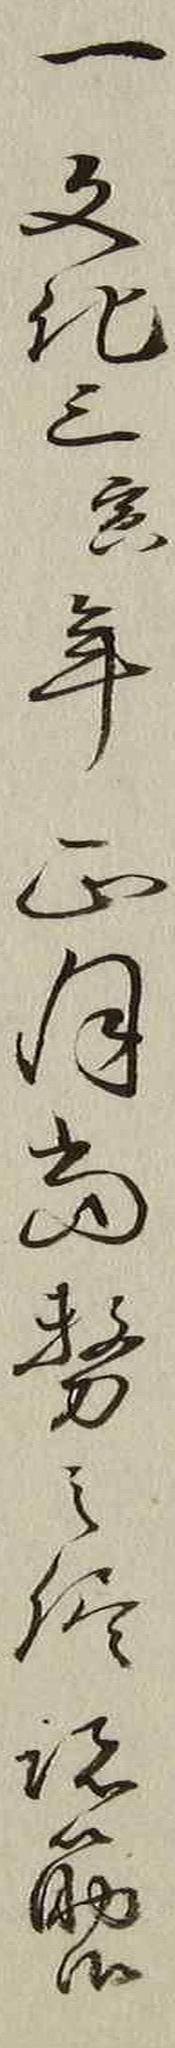一文化三寅年正月当務之儘諸筋御
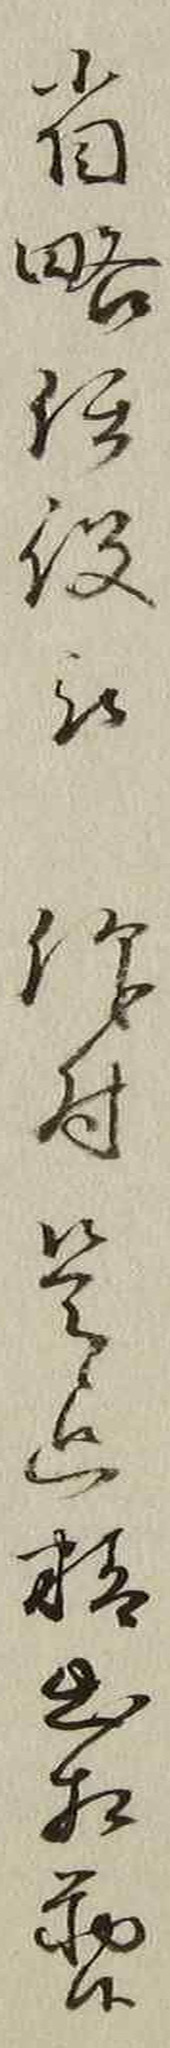省略任役被仰付是迄精出相勤候
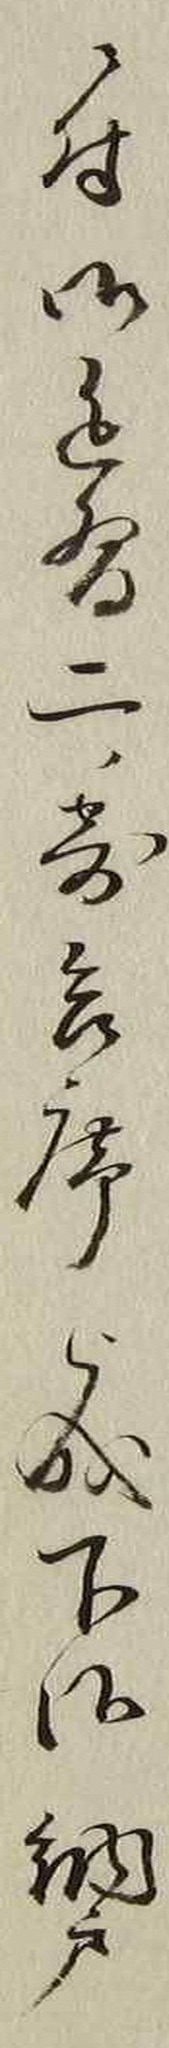ニ付御近習二ノ寄合席被成下御納戸
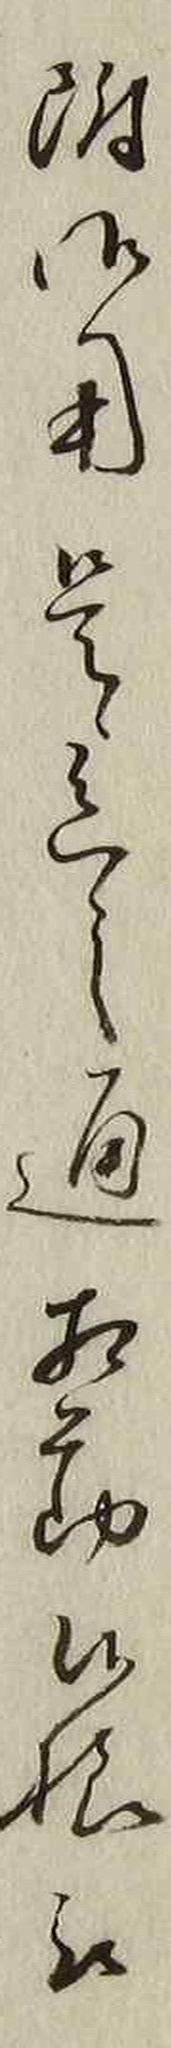附御用是迄之通相勤候様被
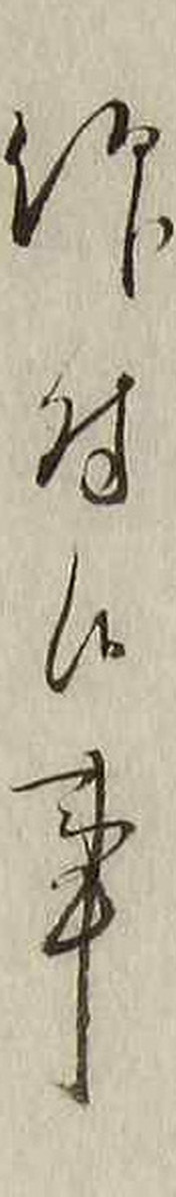仰付候事
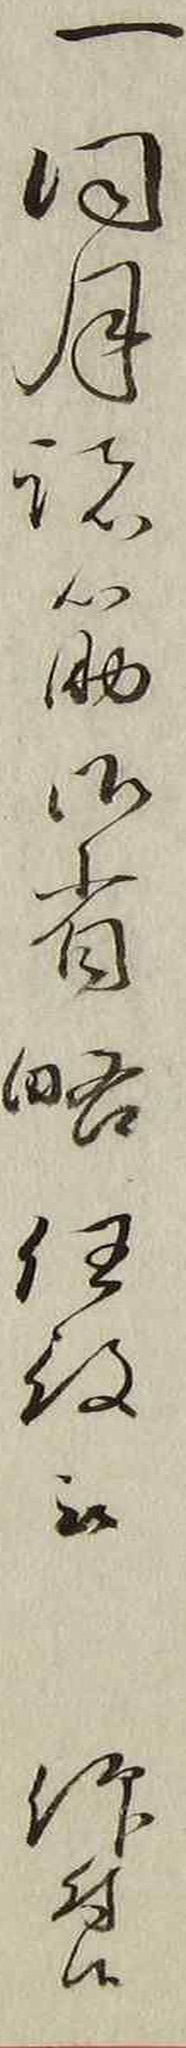一同月諸筋御省略任役被仰付候
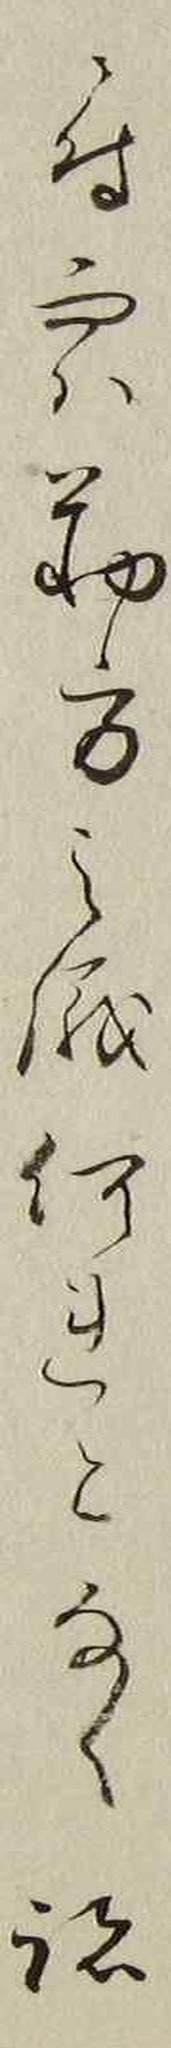ニ付而ハ勤方之儀何れとなく諸
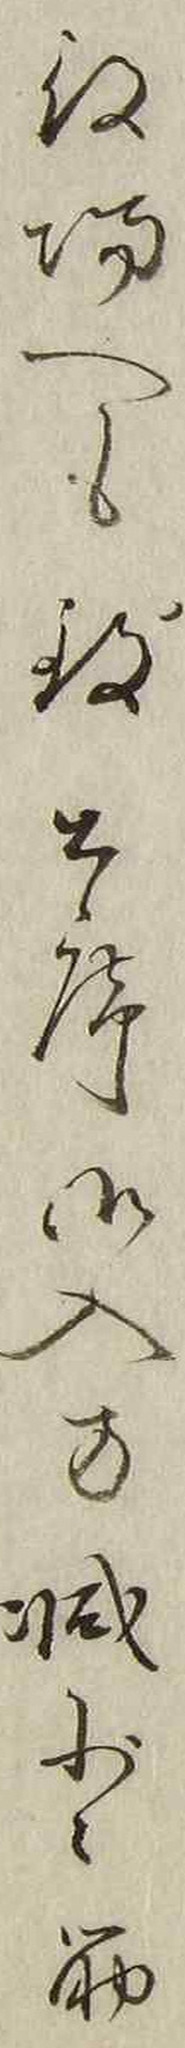役場へも致出席御入方減少之筋
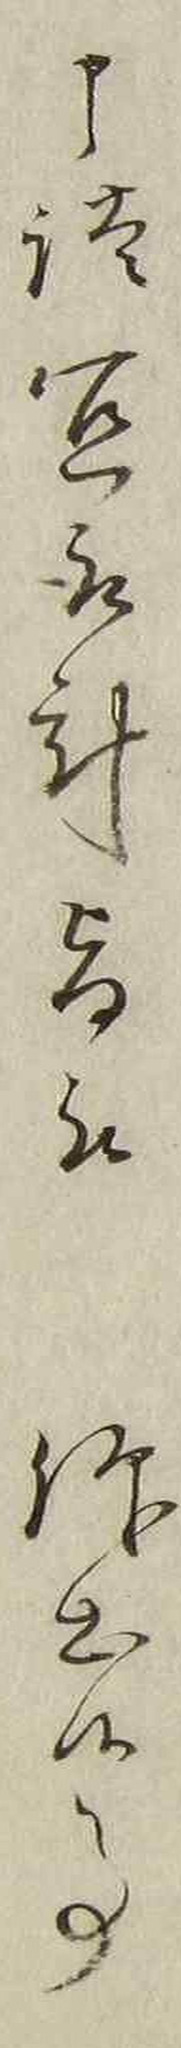申談宜取計旨被仰出候事
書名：諸士系譜　巻之4　い之部4
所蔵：会津若松市立会津図書館
